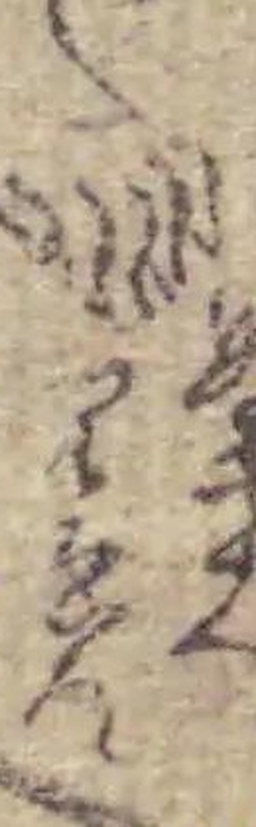りゑん
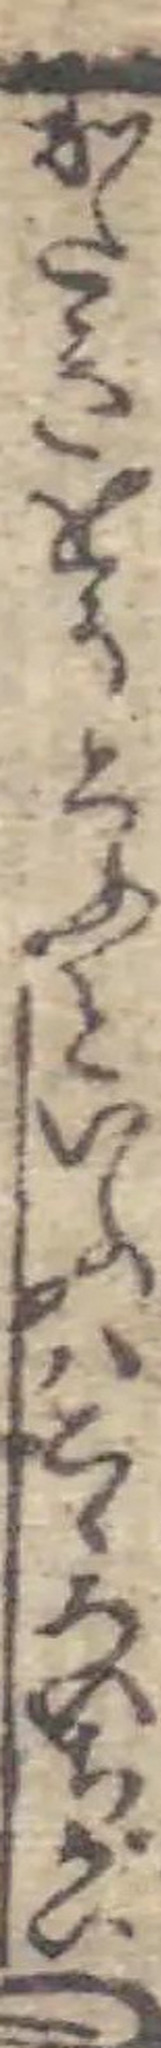かたきをうとふといふはこゝろいちがい
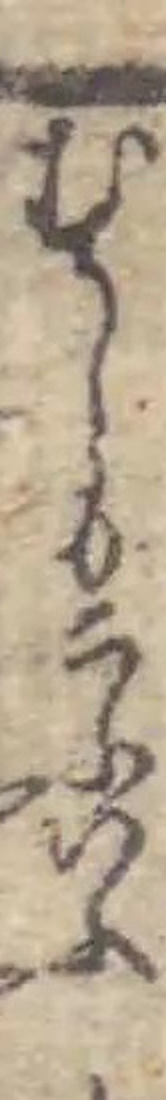むかしもこふいふ
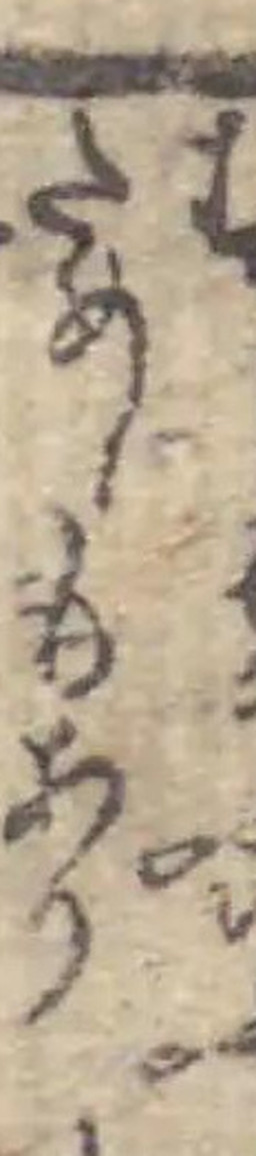ためしもあり
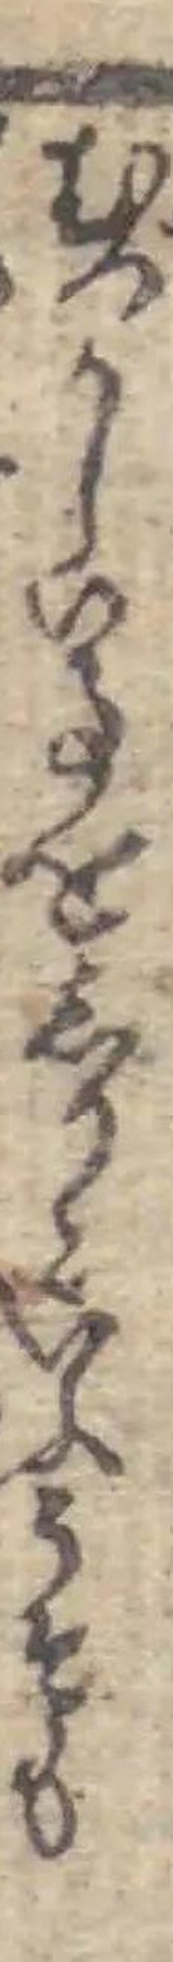むづかしい事をしりといふうそも
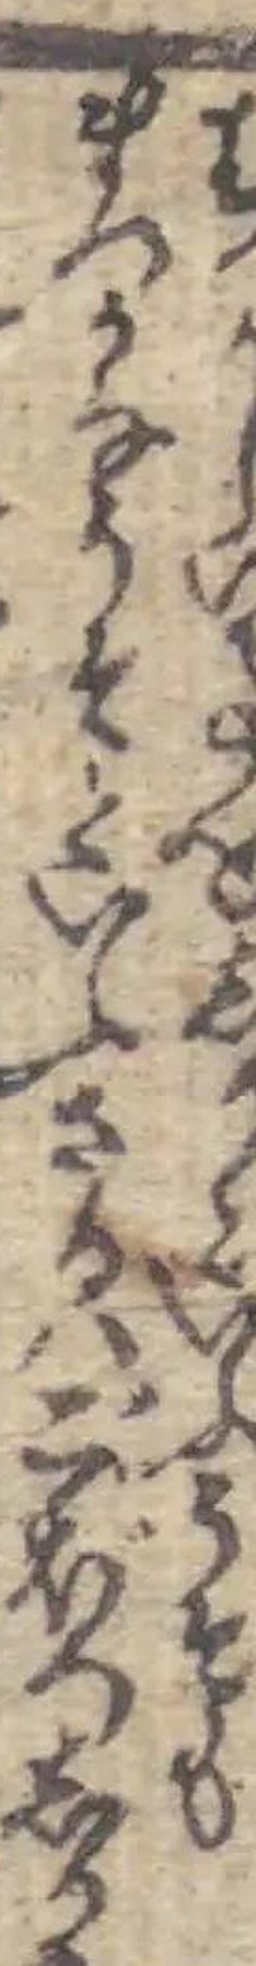まつかなうそといふさるはごぼうしり
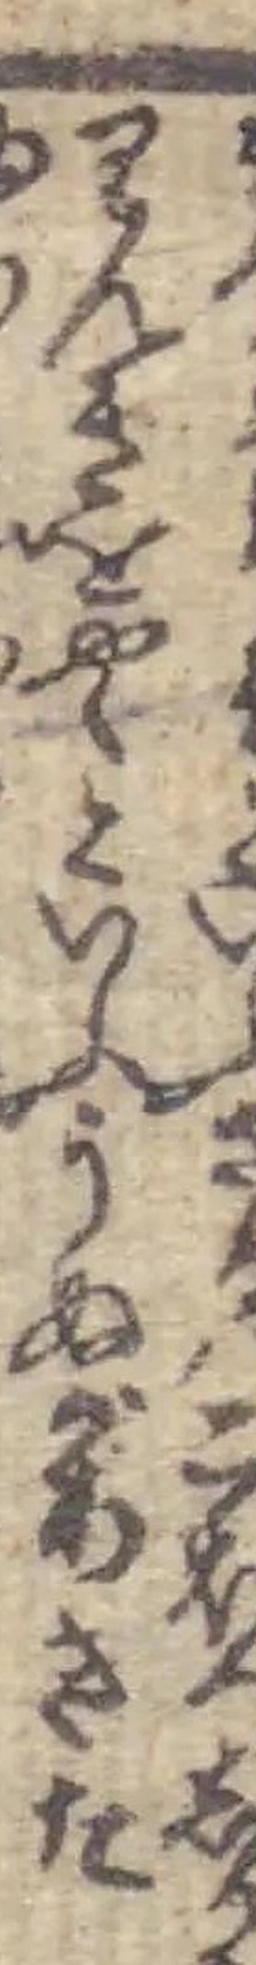りんきをやくといふうぬがあきた
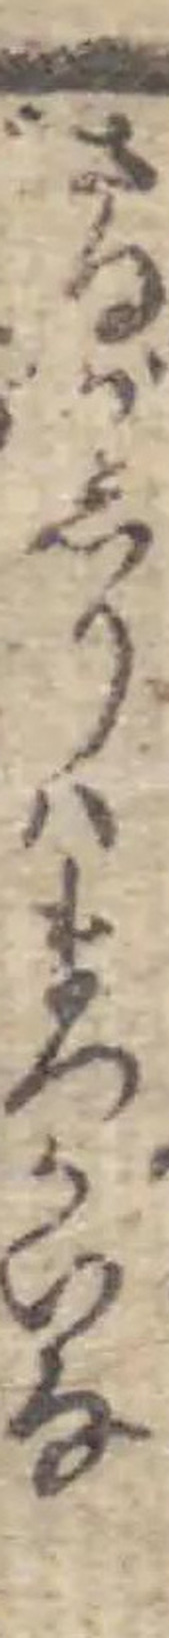さるがしりはまつかいな
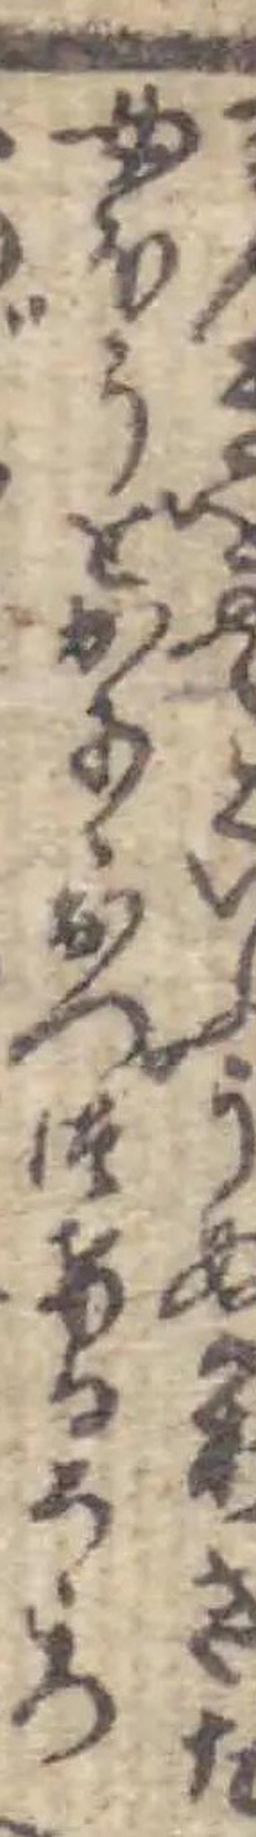女ほうをかにゝおつつけるこゝろ
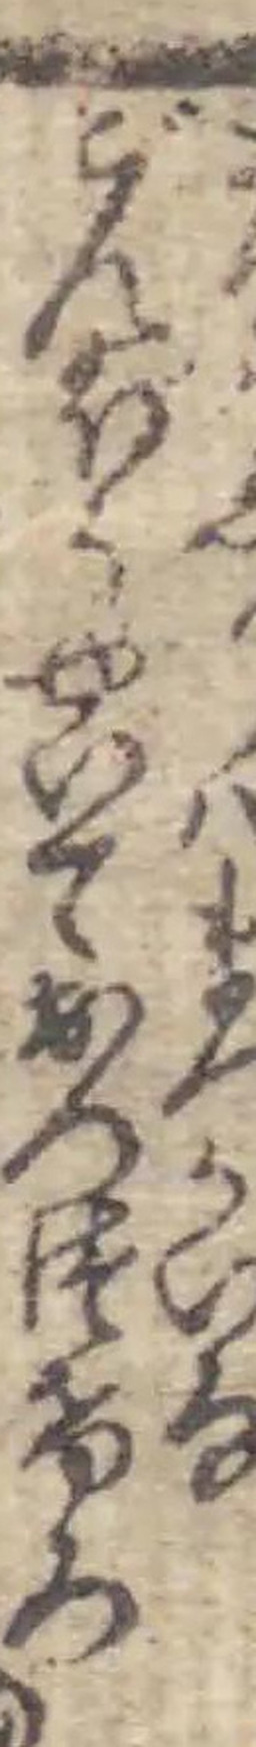ごんぼうやいておつつけろ
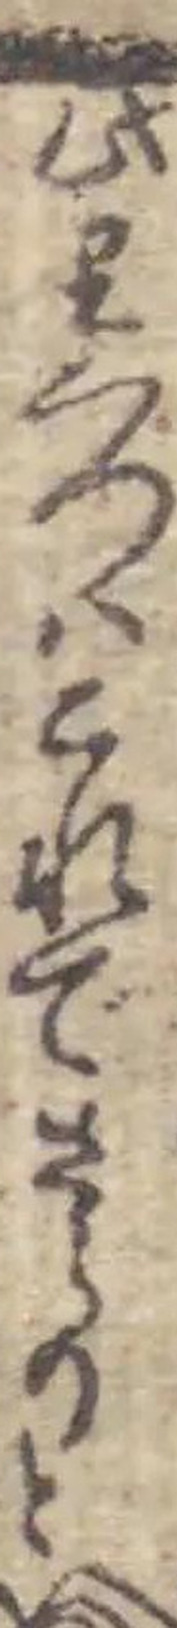此りくつはこれでさらりと
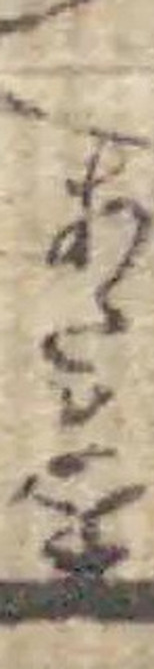あたまを
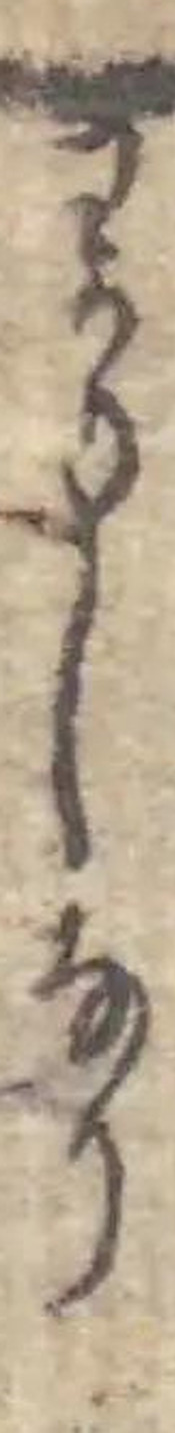わかりしなり
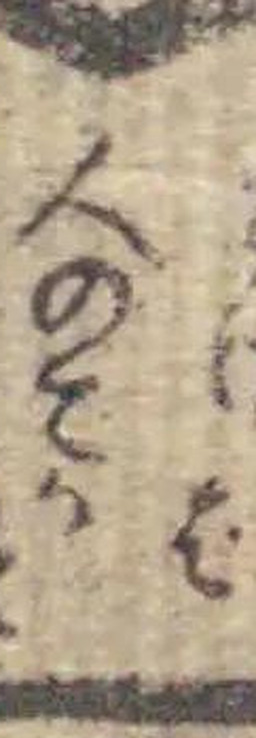人のてかと
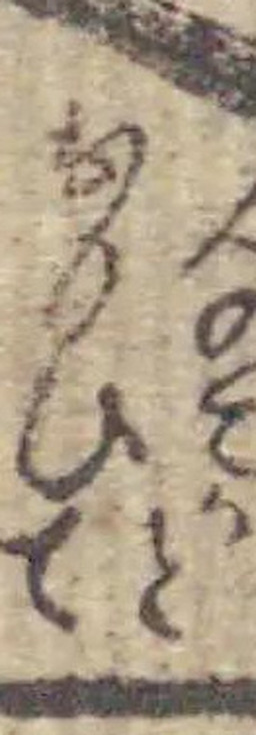おもひて
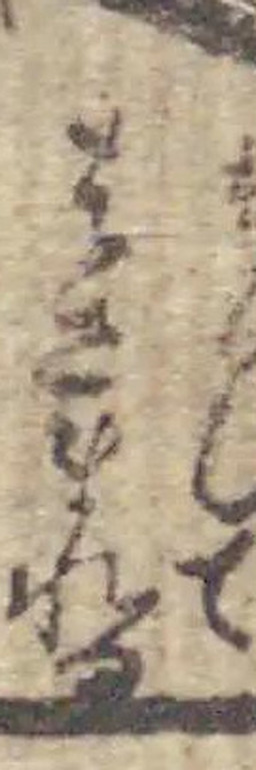はさまれる
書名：蟹牛房挟多 3巻
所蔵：国立国会図書館 National Diet Library, JAPAN
